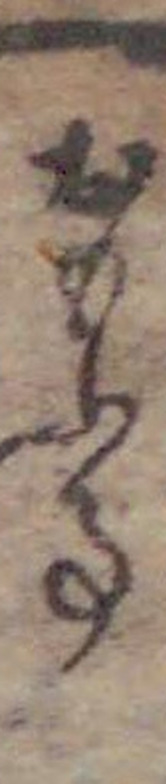おもふ事
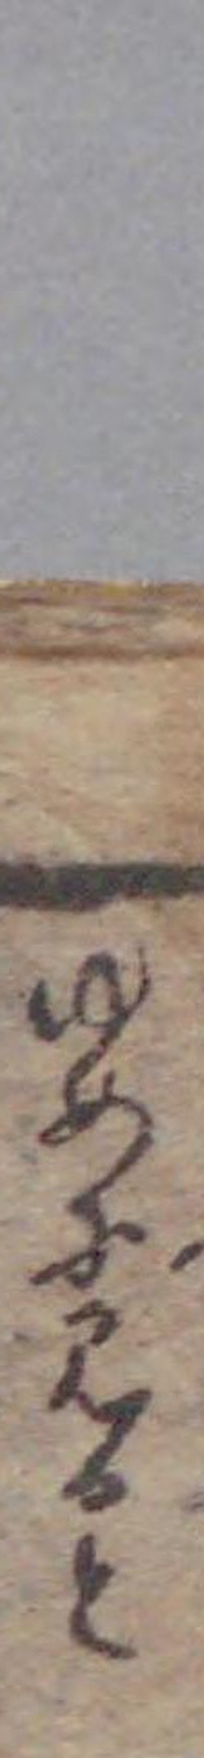ゆめにみると
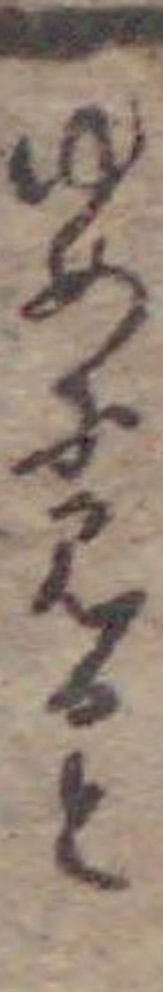ゆめにみると
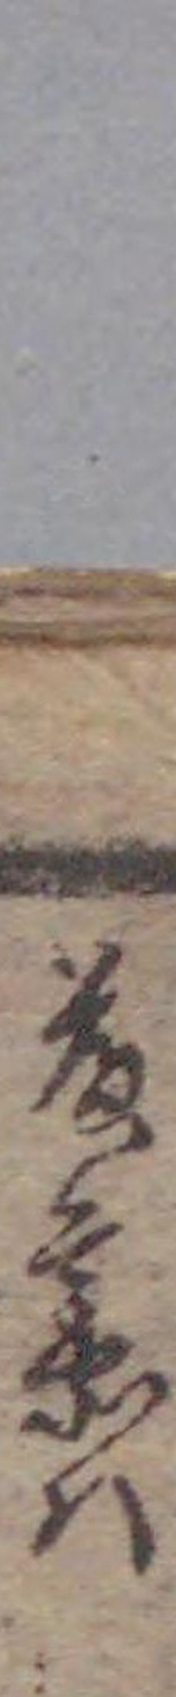藤兵衛は
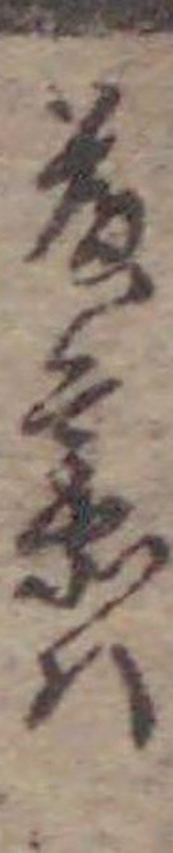藤兵衛は
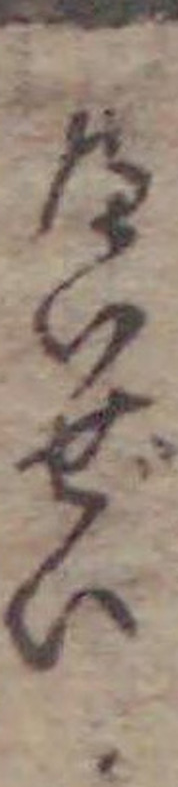へいぜい
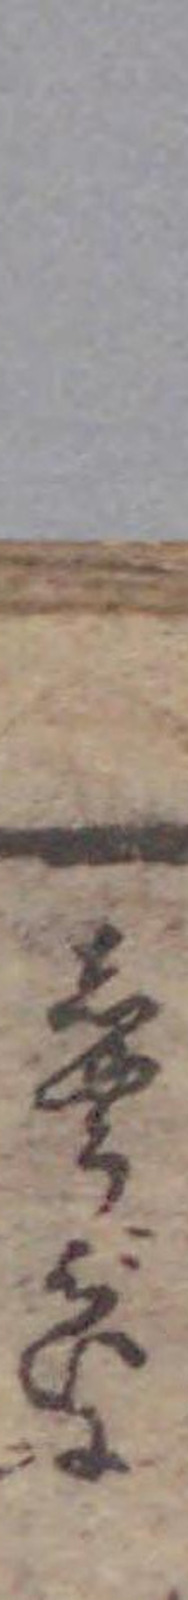しやうばいに
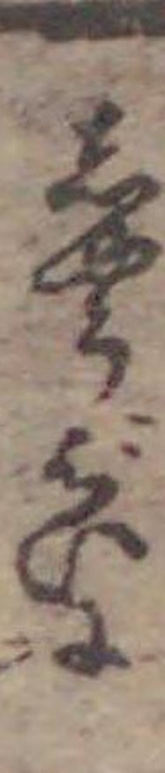しやうばいに
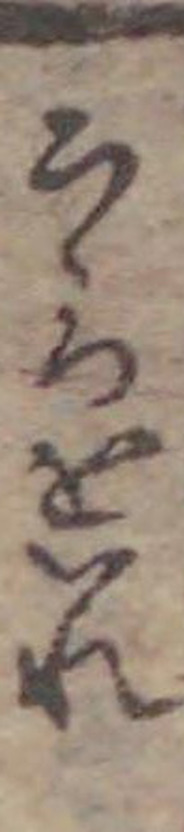こゝろをいれ
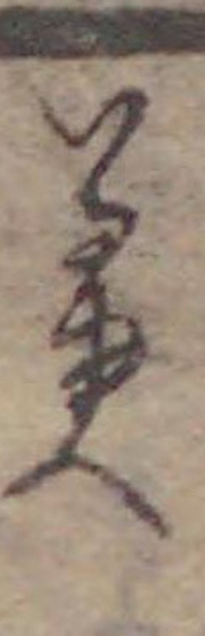いるゆへ
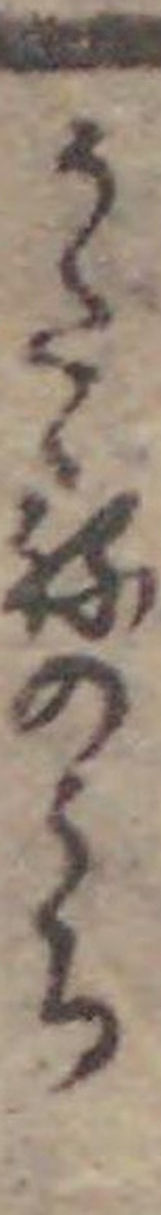うたゝねのうち
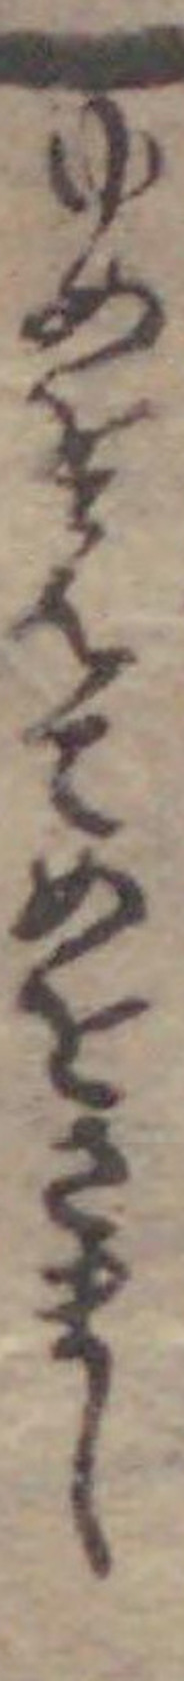ゆめをみてめをさまし
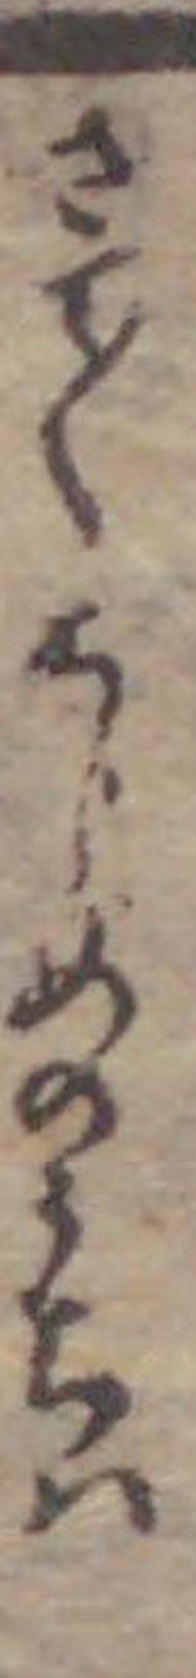さて〳〵はじめのうちは
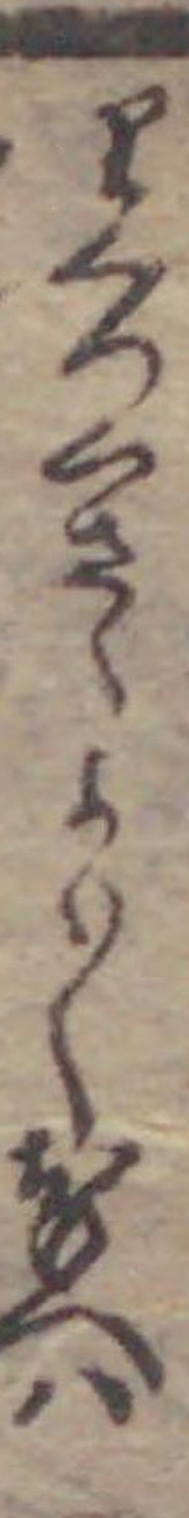りくつくさくよく〳〵おもへは
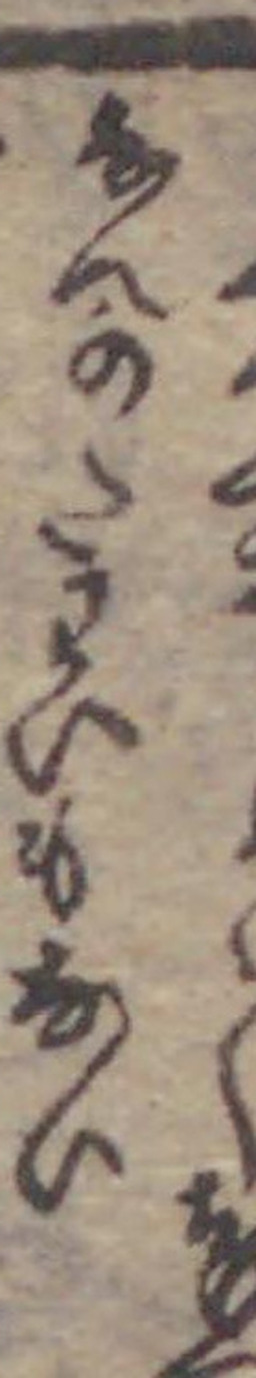なんのたわいもない
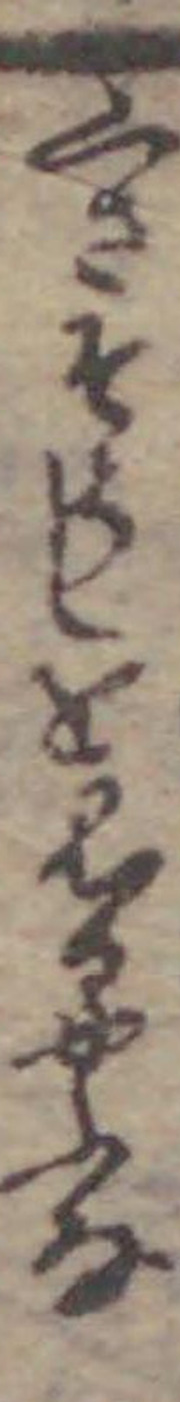くさそうしをみるやうな
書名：談芭菰誉詞 : 3巻
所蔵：国立国会図書館 National Diet Library, JAPAN
